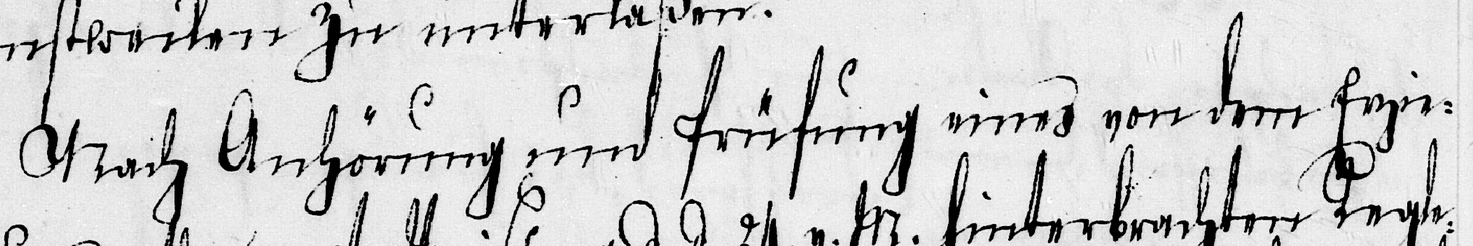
Nach Anhörung und Prüfung eines von dem Erzie¬
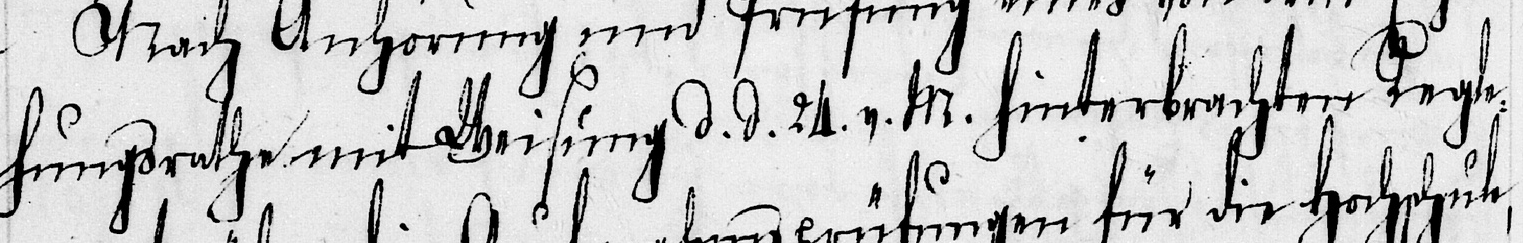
hungsrathe mit Weisung d. d. 24. v. M. hinterbrachten Regle¬
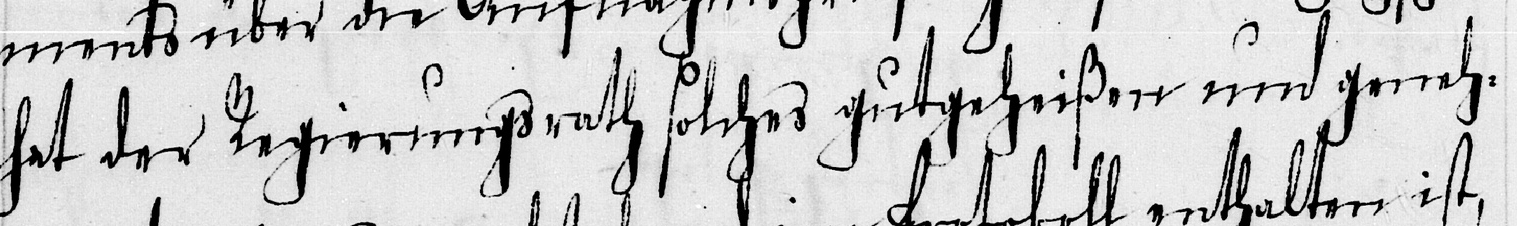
hat der Regierungsrath solches gutgeheißen und geneh¬
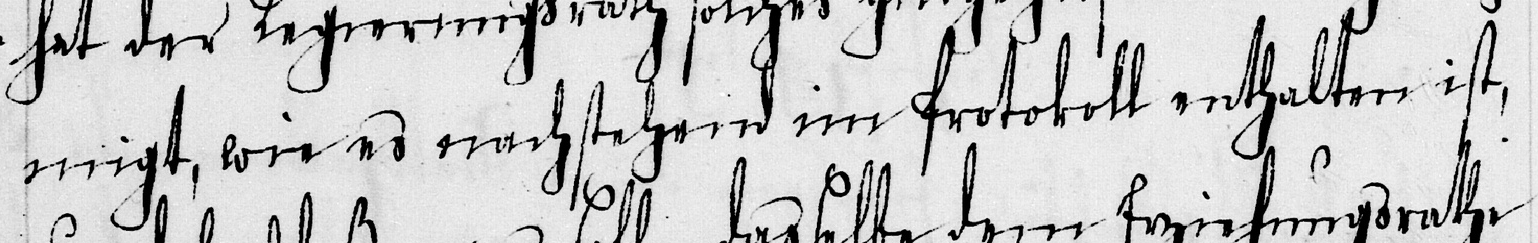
migt, wie es nachstehend im Protokoll enthalten ist,
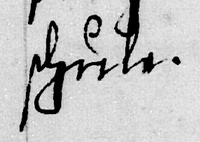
schule,
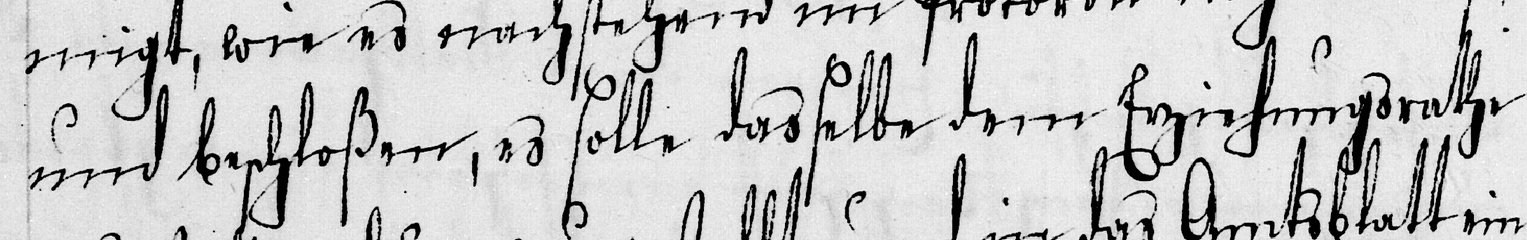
und beschloßen, es solle dasselbe dem Erziehungsrathe
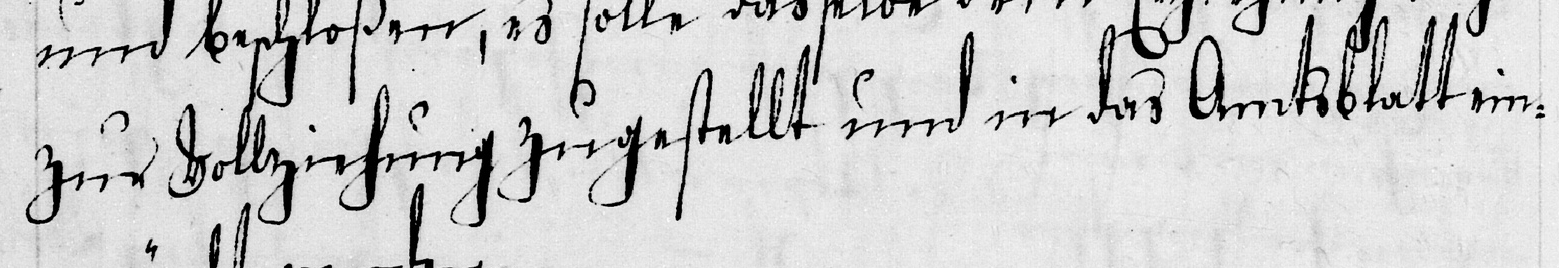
zur Vollziehung zugestellt und in das Amtsblatt ein¬
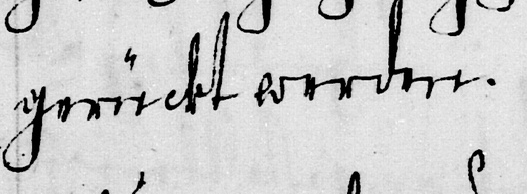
gerückt werden.
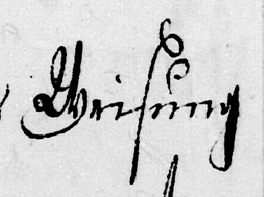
Weisung
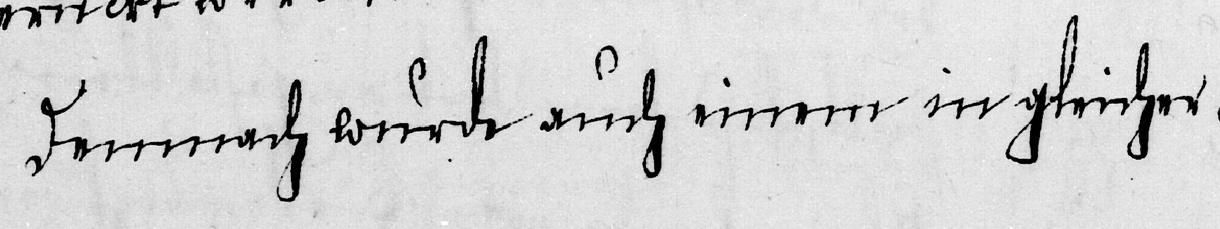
Demnach wurde auch einem in gleicher
